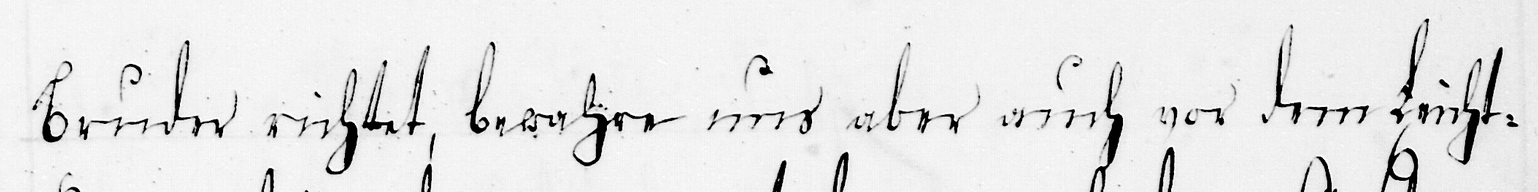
Bruder richtet, bewahre uns aber auch vor dem Leicht¬
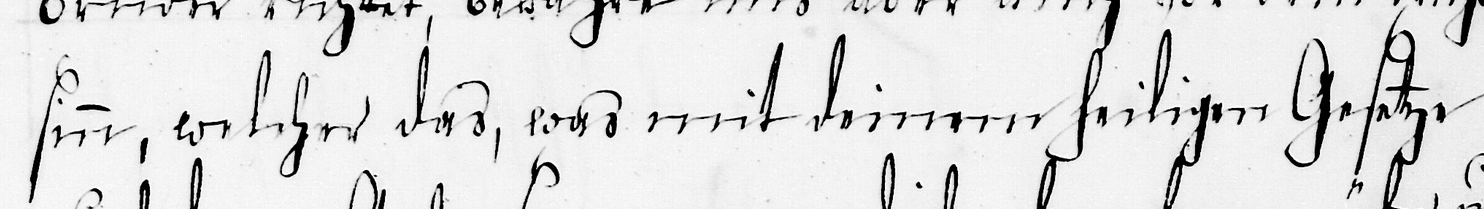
sinn, welcher das, was mit deinem heiligen Gesetze
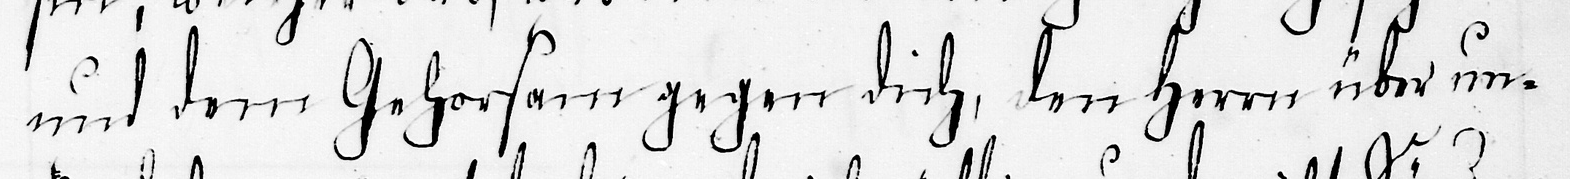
und dem Gehorsam gegen dich, den Herrn über un¬
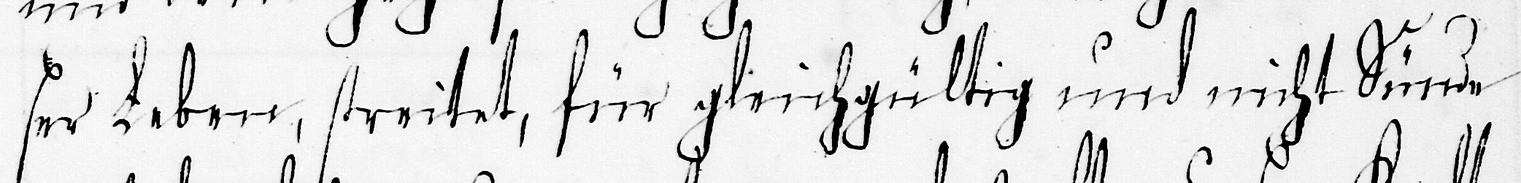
ser Leben, streitet, für gleichgültig und nicht Sünde
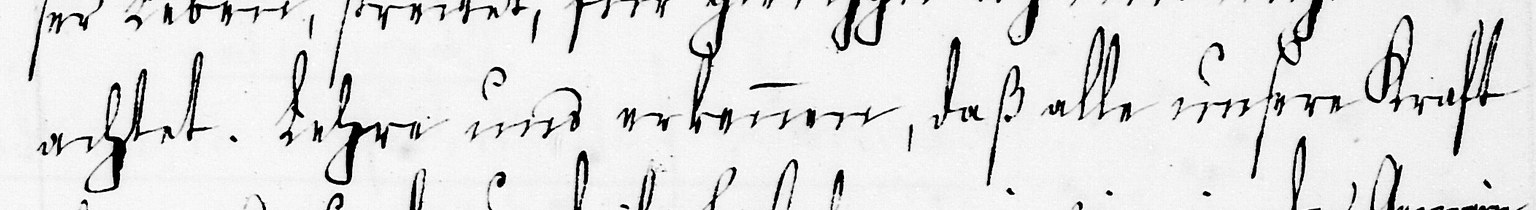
achtet. Lehre uns erkennen, daß alle unsere Kraft
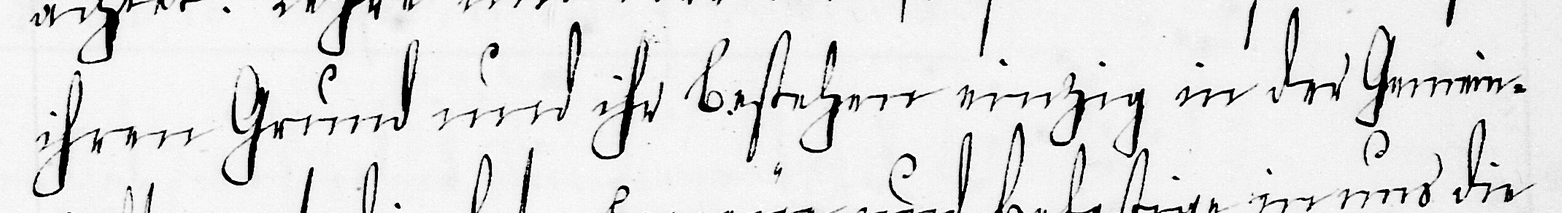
ihren Grund und ihr Bestehen einzig in der Gemein¬
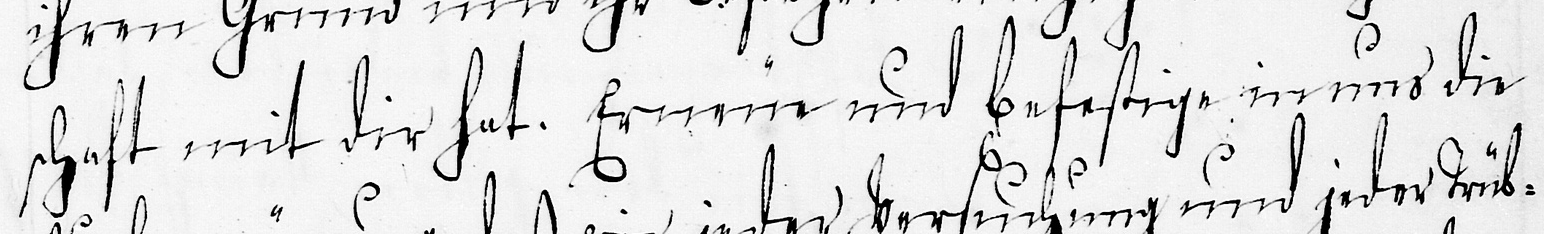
schaft mit dir hat. Erneue und befestige in uns die
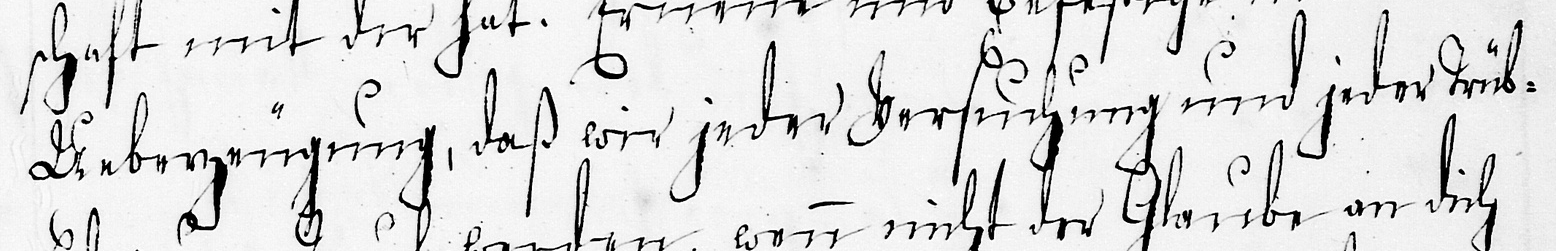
Ueberzeugung, daß wir jeder Versuchung und jeder Trüb¬
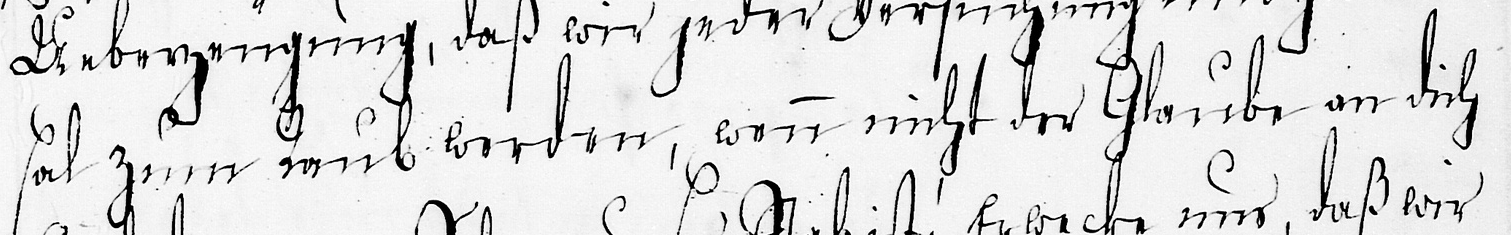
sal zum Raub werden, wenn nicht der Glaube an dich
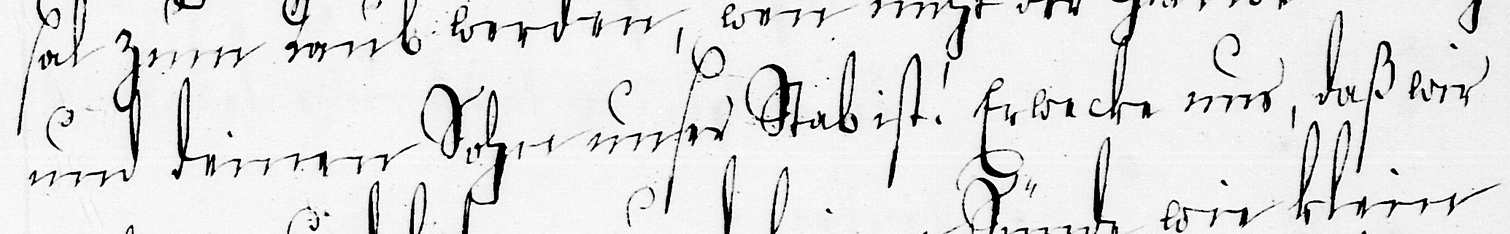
und deinen Sohn unser Stab ist! Erwecke uns, daß wir
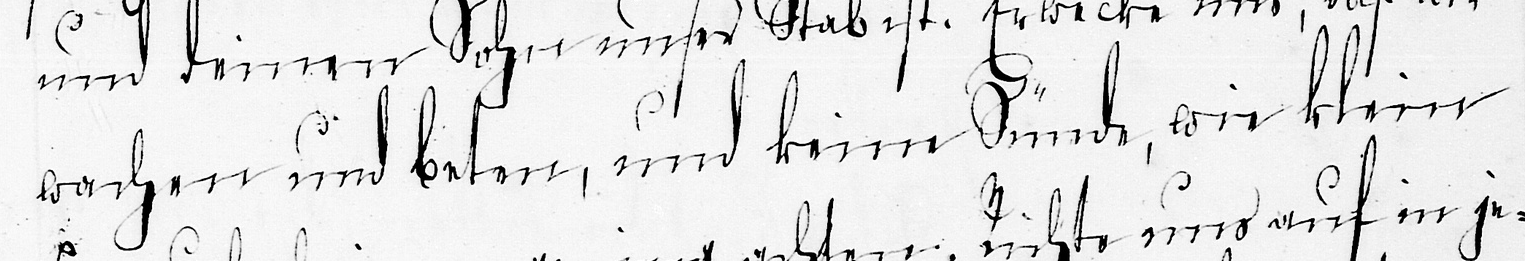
wachen und beten, und keine Sünde, wie klein
